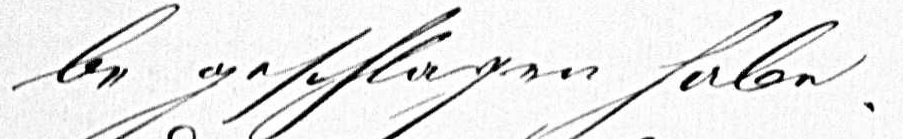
be geschlagen habe.
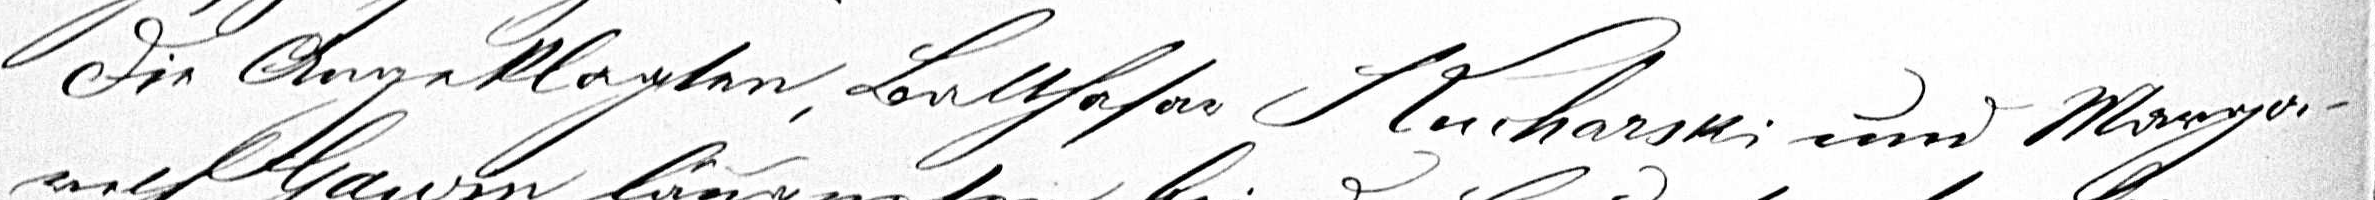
Die Angeklagten, Balthasar Kucharski und Marga¬
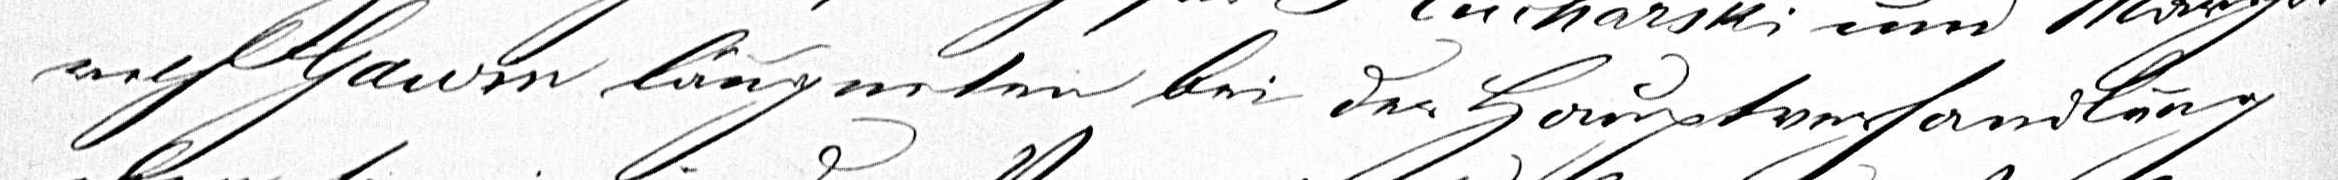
reth Gawin, läugneten bei der Hauptverhandlung
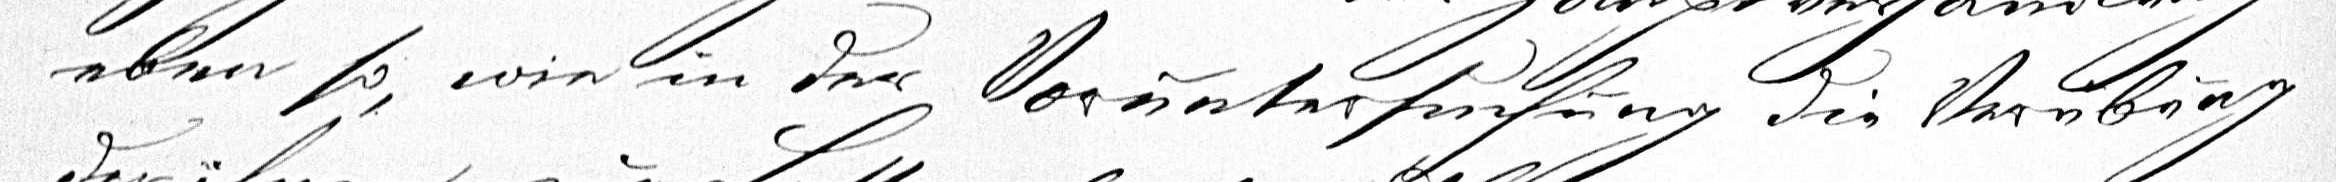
eben so, wie in der Voruntersuchung die Verübung
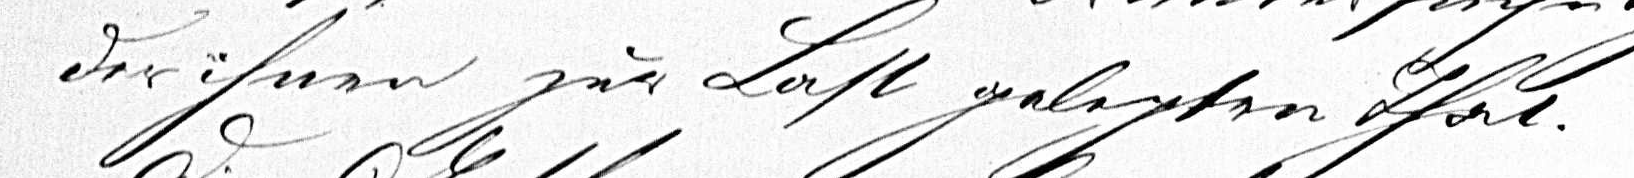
der ihnen zur Last gelegten That.
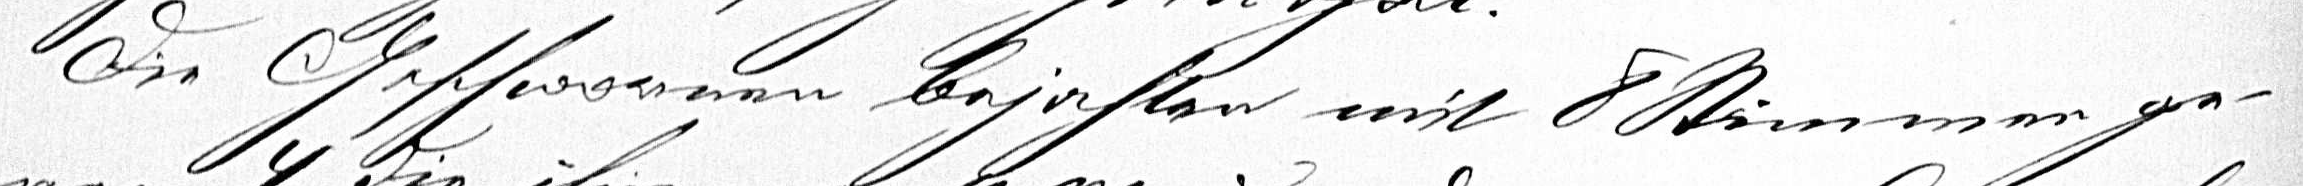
Die Geschworenen bejahften mit 8 Stimmen ge¬
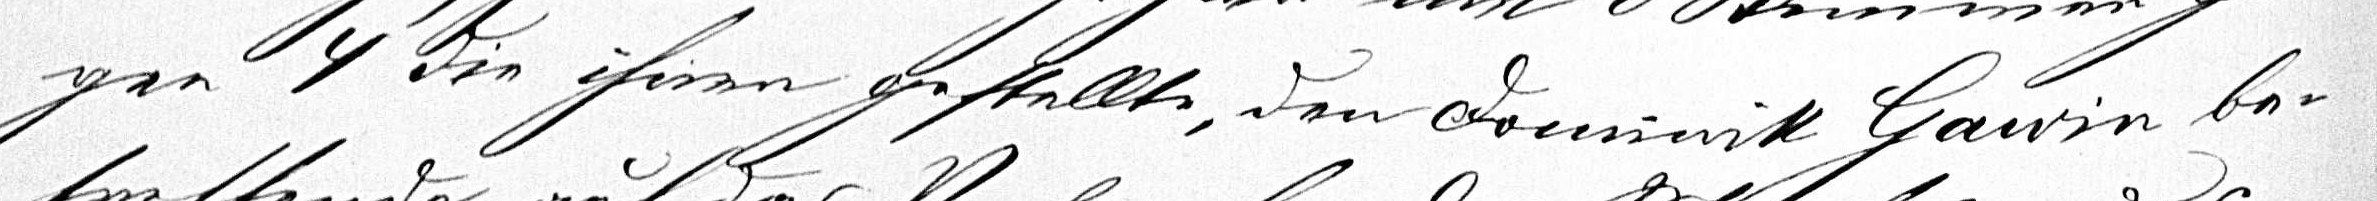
gen 4 die ihnen gestellte, den Dominik Gawin be¬
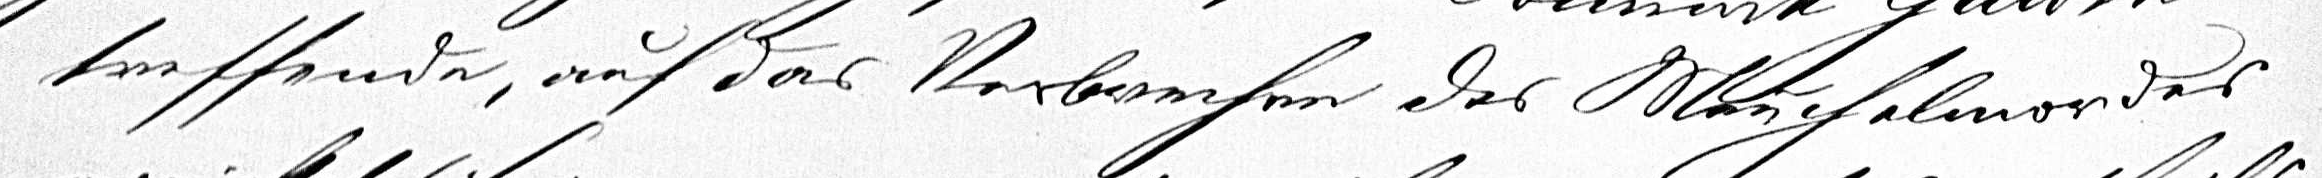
treffende, auf das Verbrechen der Meuchelmordes
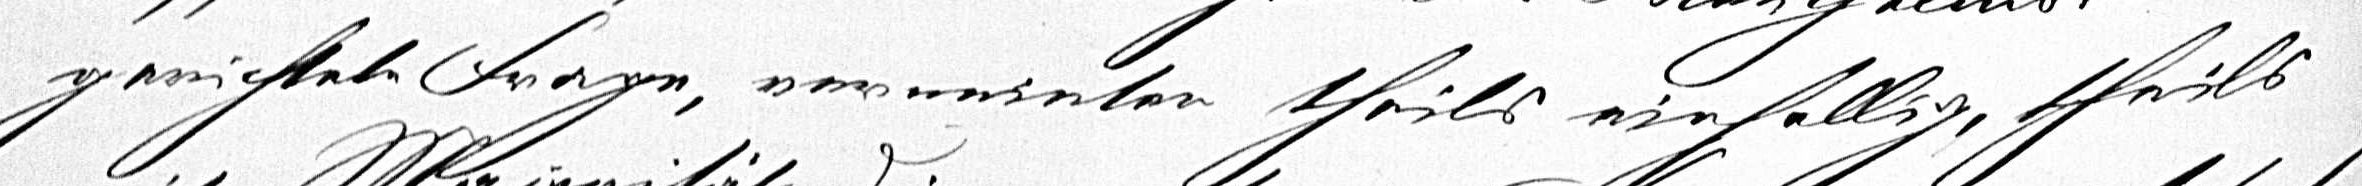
gerichtete Frage, verneinten theils einhellig, theils
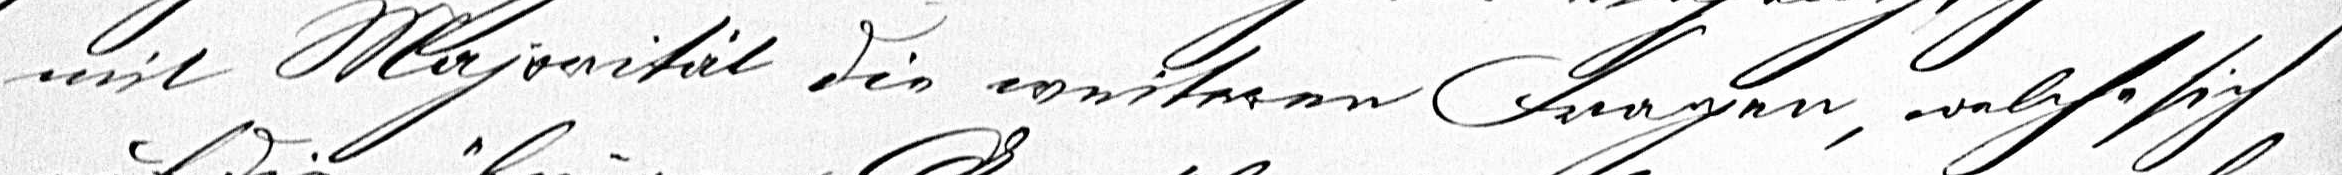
mit Majorität die weiteren Fragen, welche sich
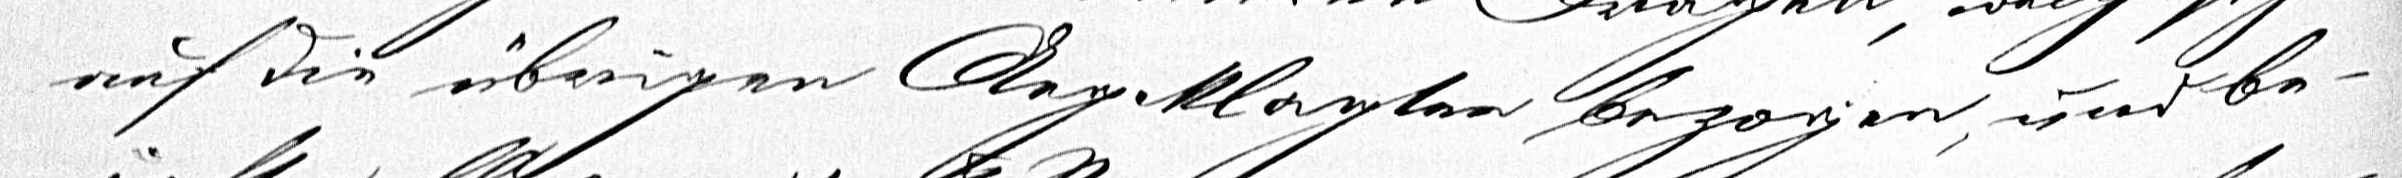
auf die übrigen Angeklagten bezogen, und be¬
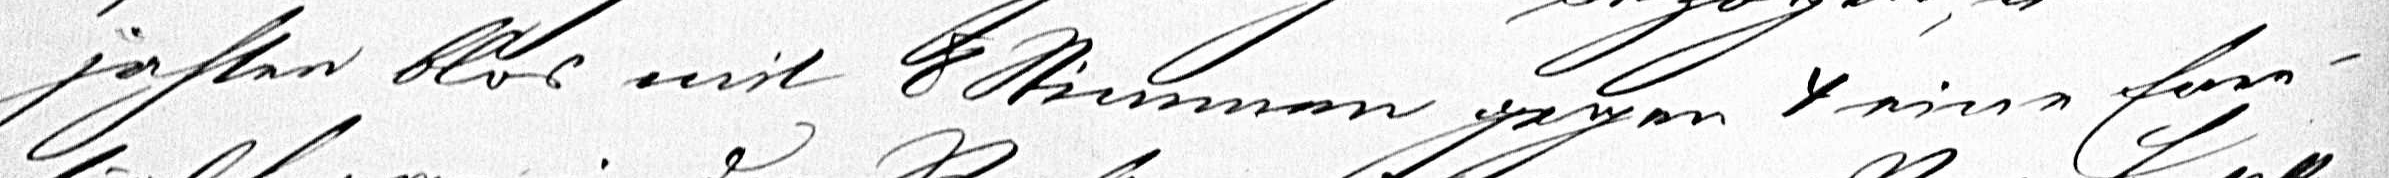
jahten blos mit 8 Stimmen gegen 4 eine Even¬
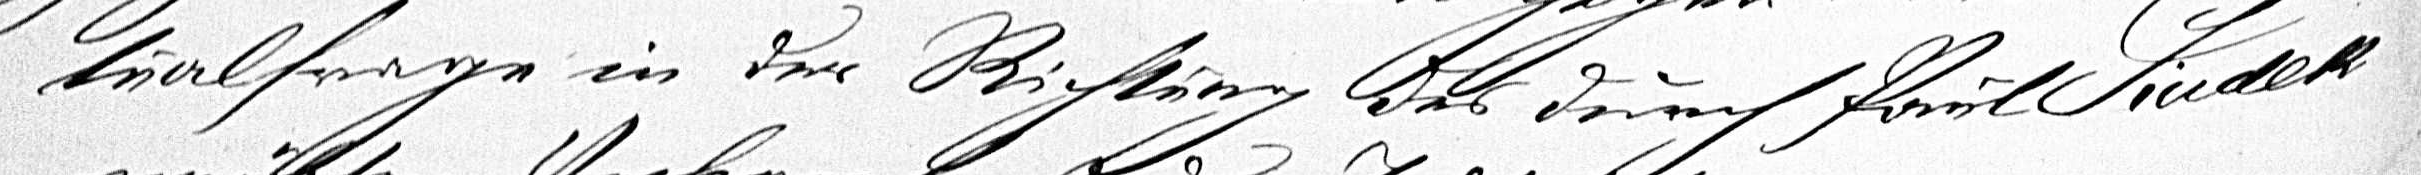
tualfrage in der Richtung des durch Paul Sindek
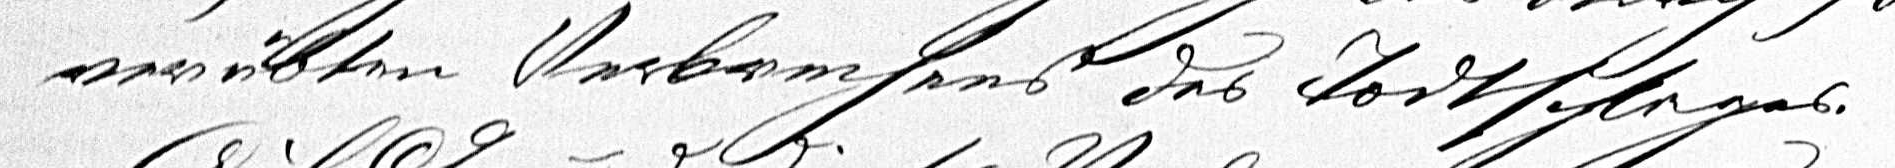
verübten Verbrechens des Todtschlages.
